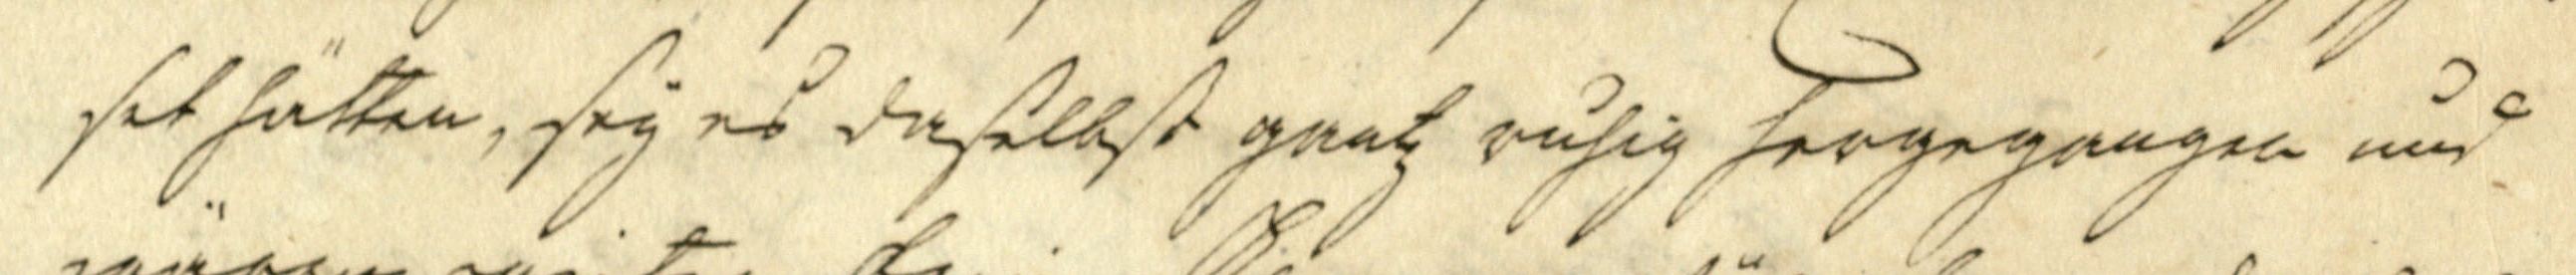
set hätten, sey es daselbst gantz ruhig hergegangen und
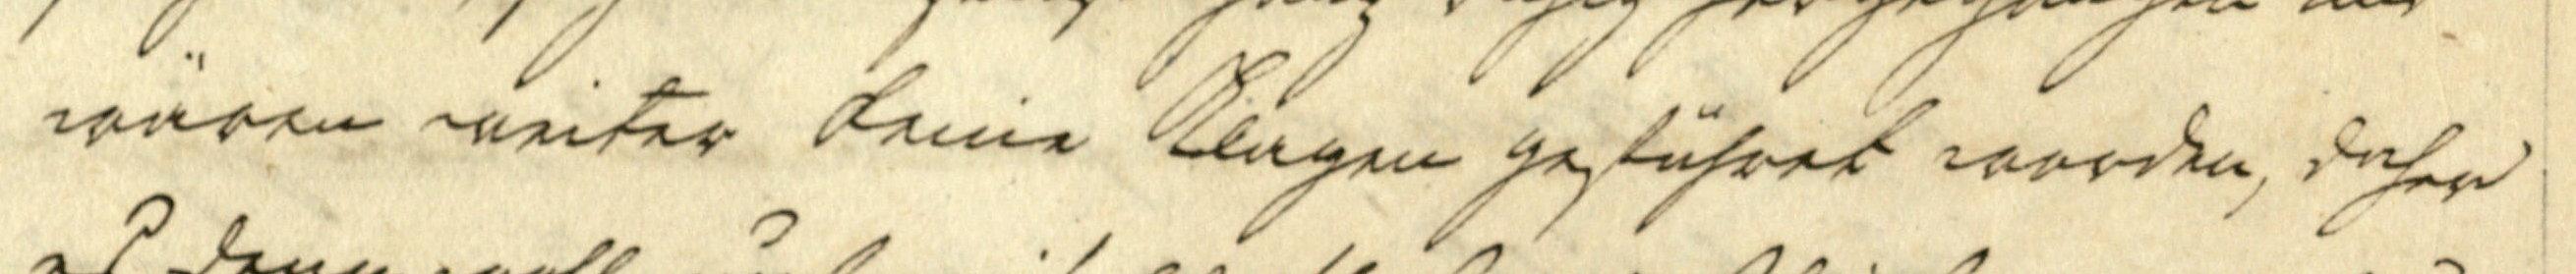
wären weiter keine Klagen geführet worden, daher
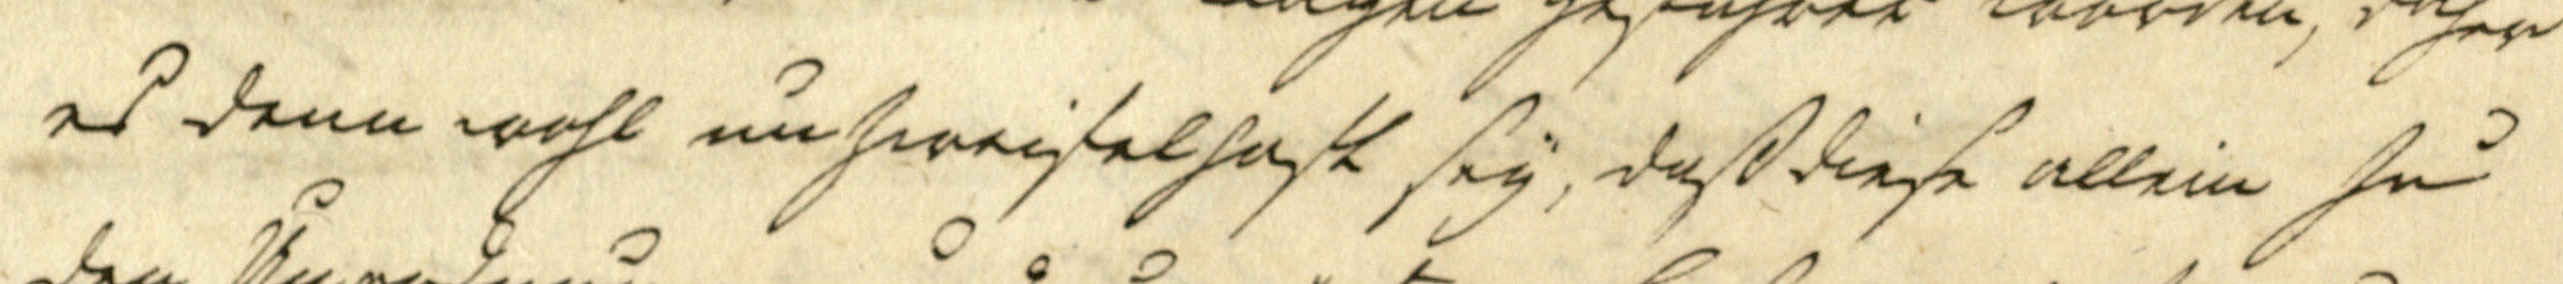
es denn wohl unzweifelhaft seÿ, daß diese allein zu
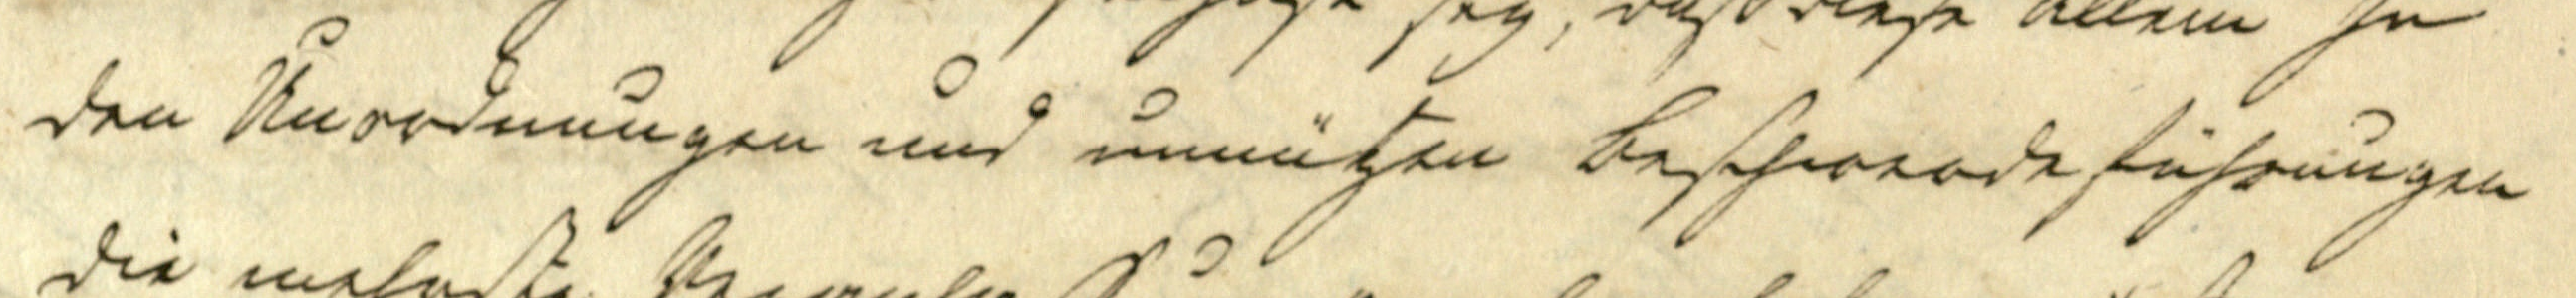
den Unordnungen und unnützen Beschwerdeführungen
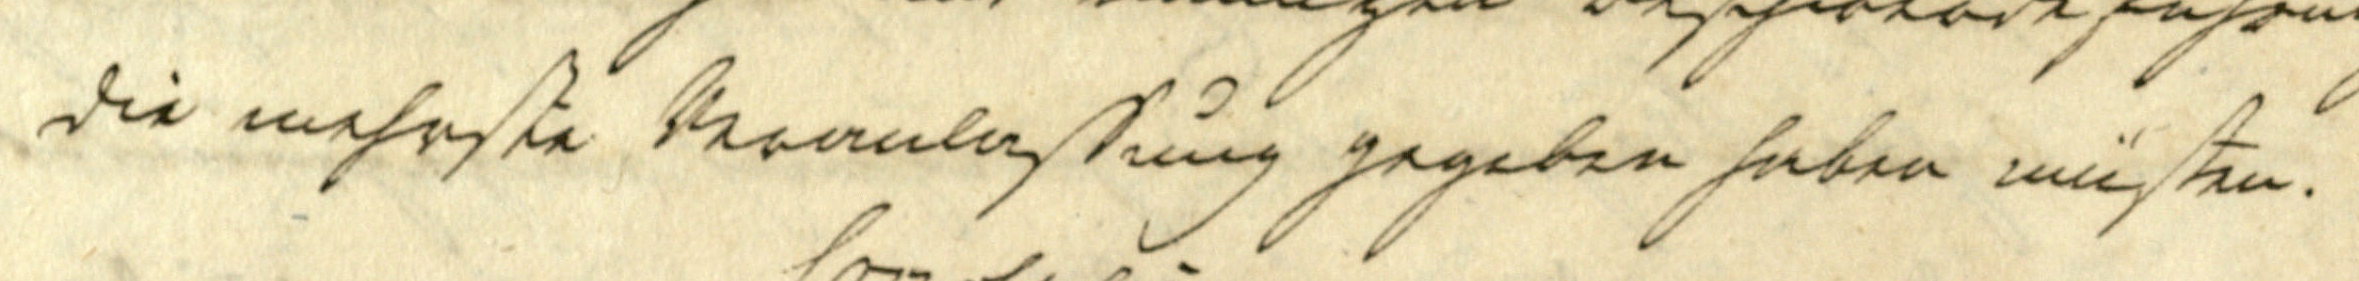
die mehrste Veranlassung gegeben haben müßten.
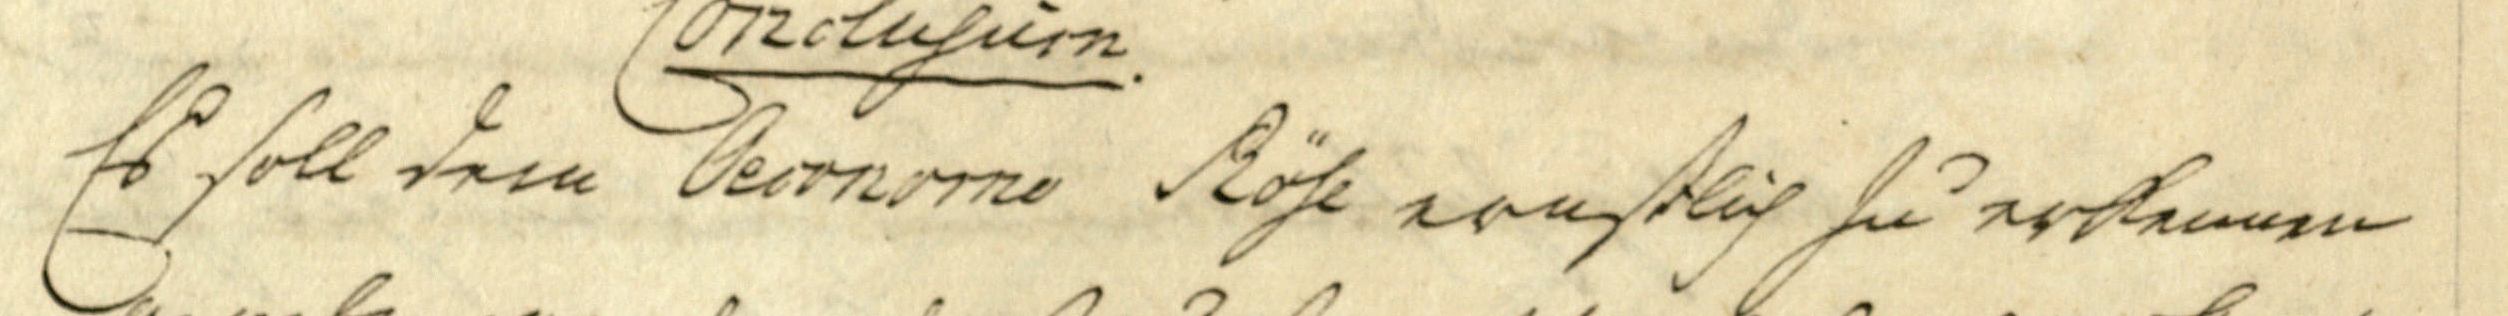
Es soll dem Oeconomo Röse ernstlich zu erkennen
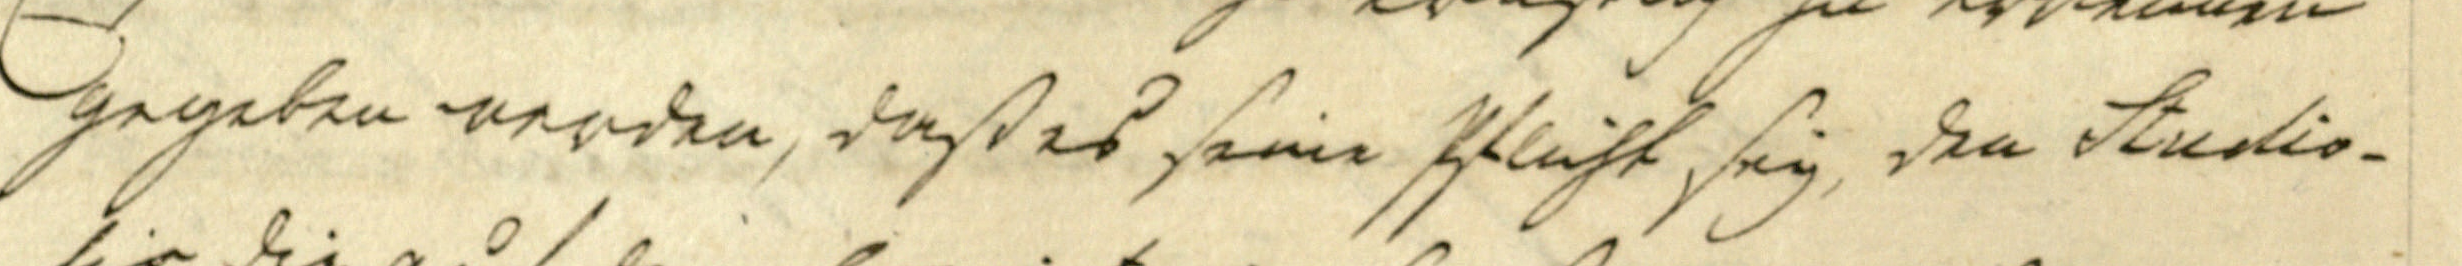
gegeben werden, daß es seine Pflicht seÿ, den Stuio¬
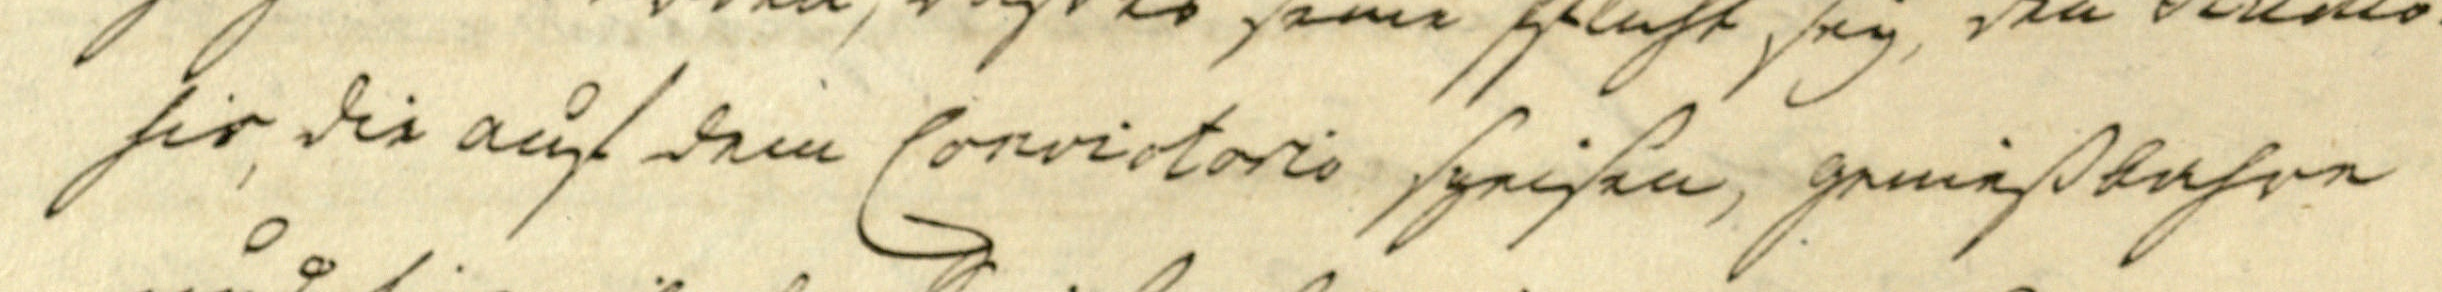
sis, die auf dem Convictorio speisen, genießbahre
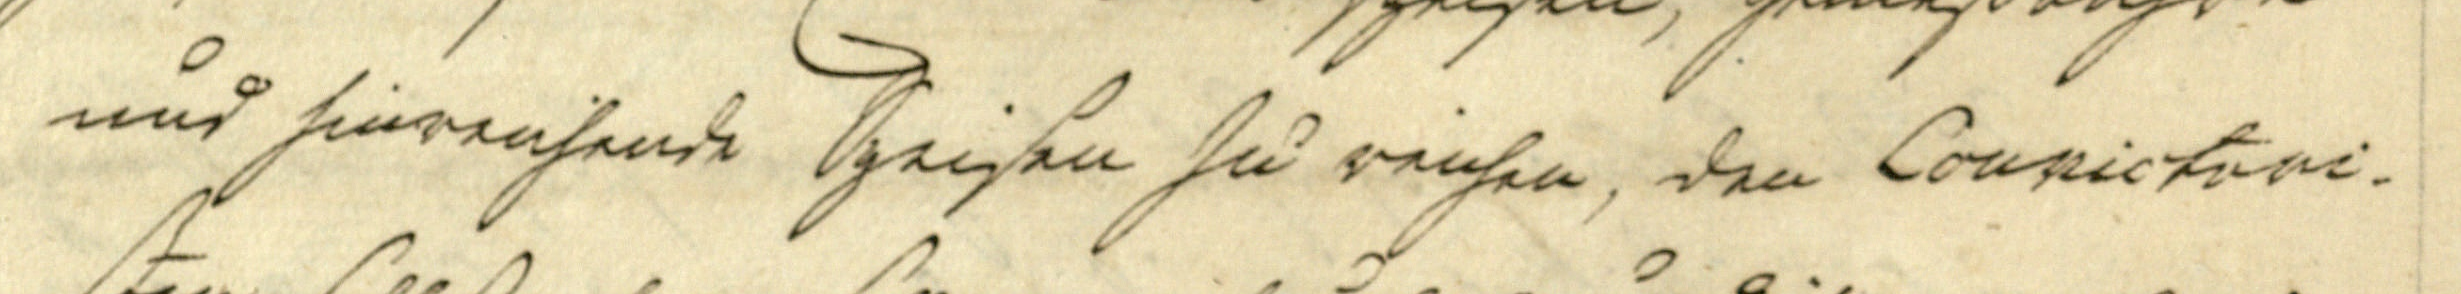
und hinreichende Speisen zu reichen, den Convictori¬
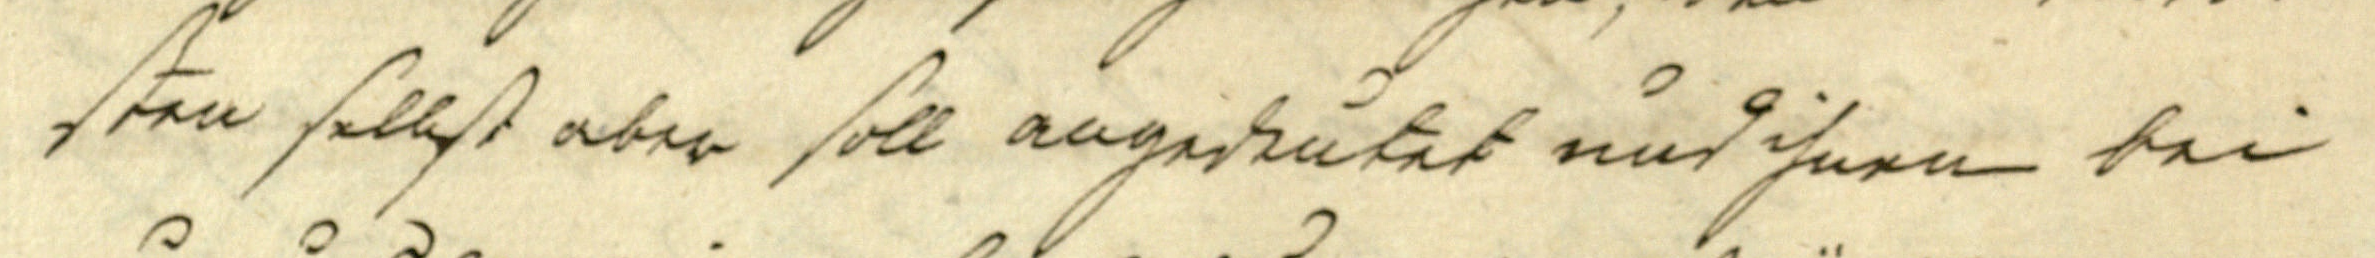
sten selbst aber soll angedeutet und ihnen bei
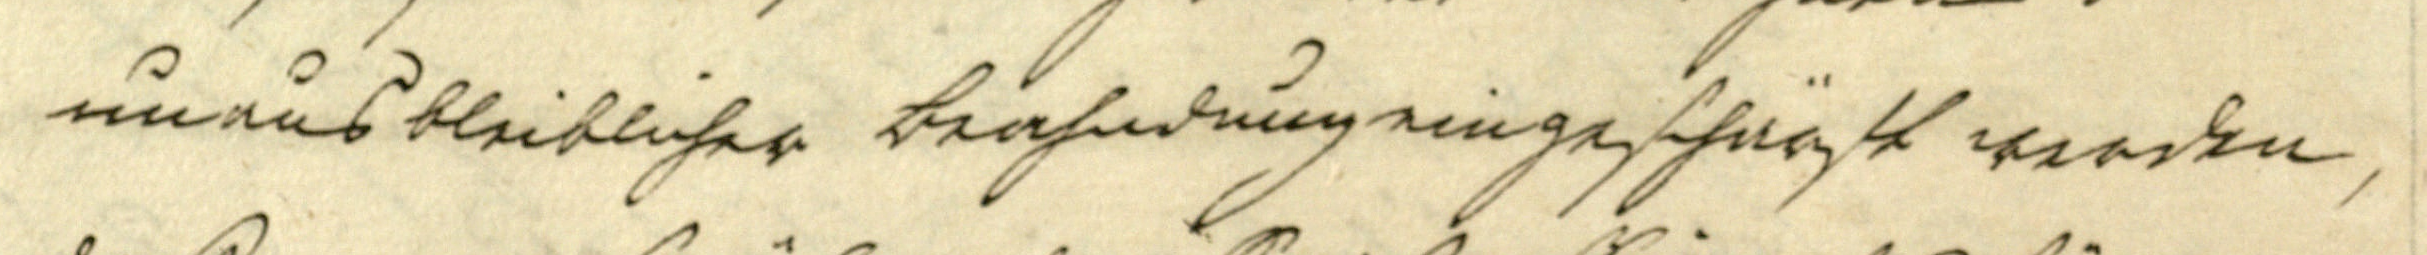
unausbleiblicher Beahndung eingeschärft werden,
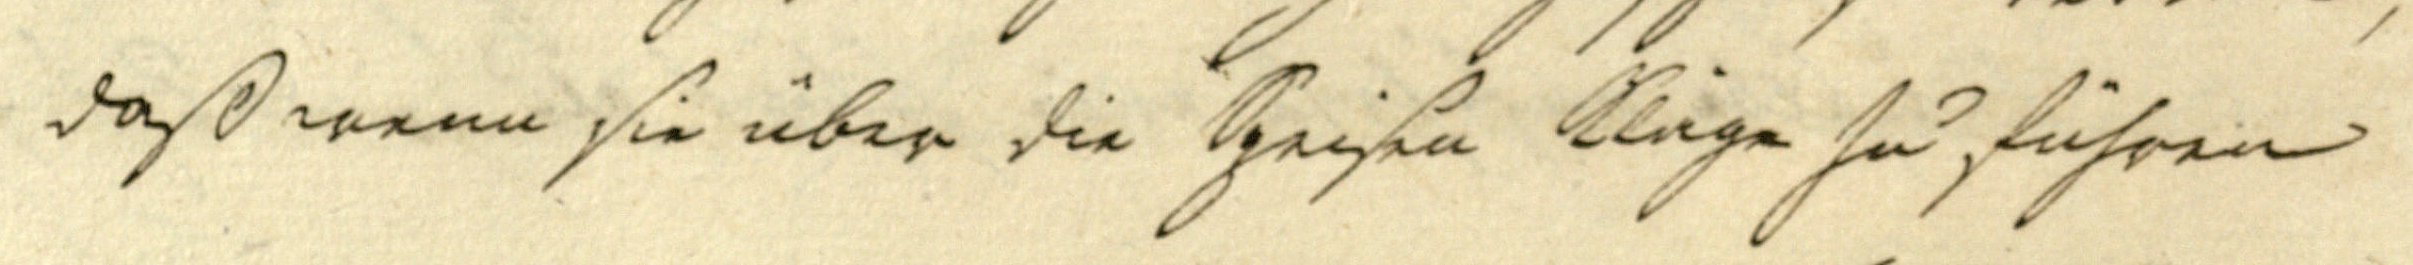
daß wenn sie über die Speisen Klage zu führen
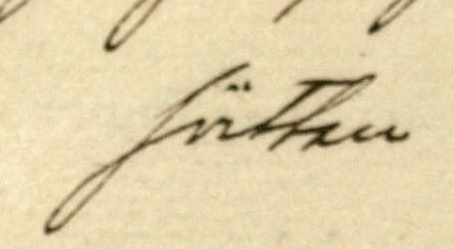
hätten
